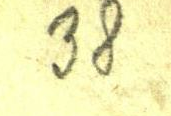38
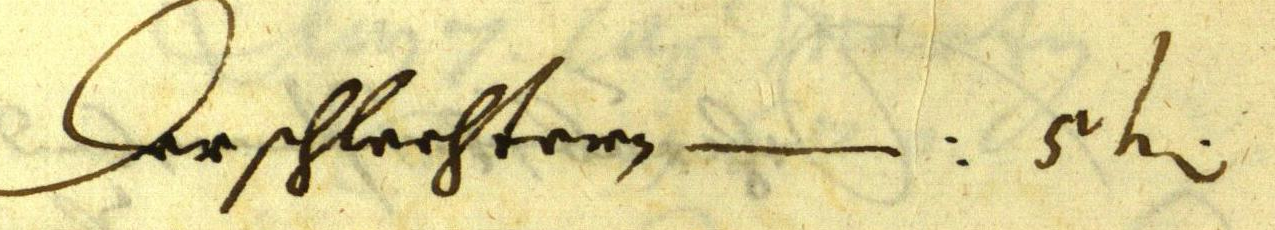Der schlechtern —: 5 k.
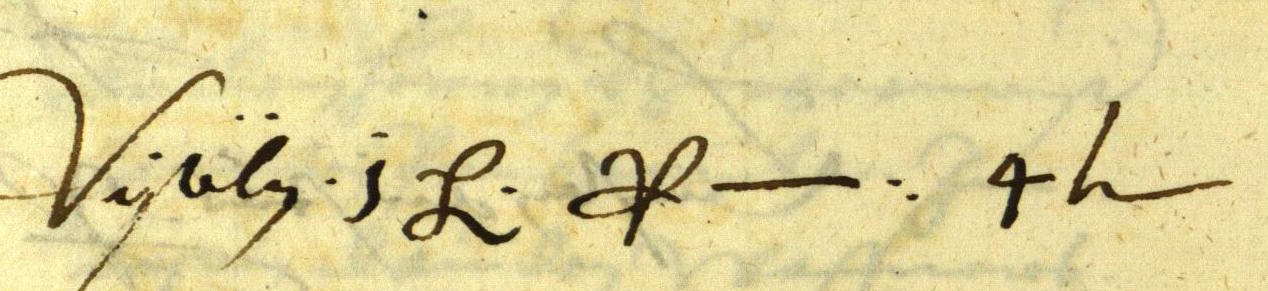Visoln. 1 L. P —: 4 k.
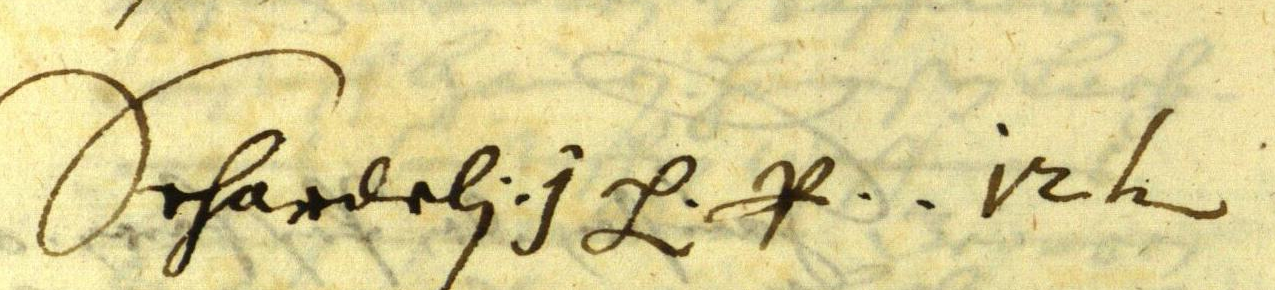Schardeli. 1 L. P. .12 k.
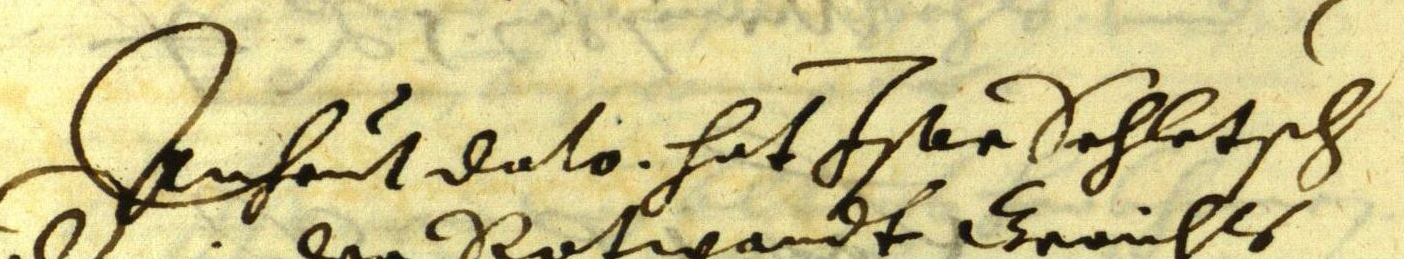Anheūt dato, hat Isac Schletsch
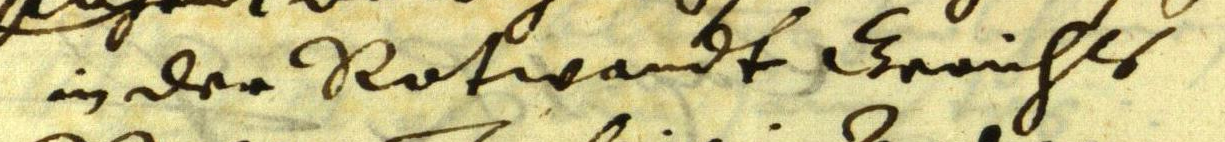in der Rotwandt Gerichts
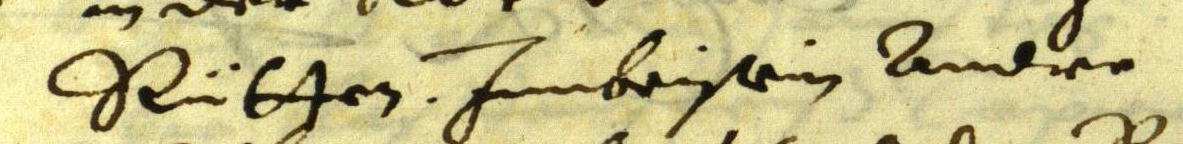Rütten. Innbeisein Andre
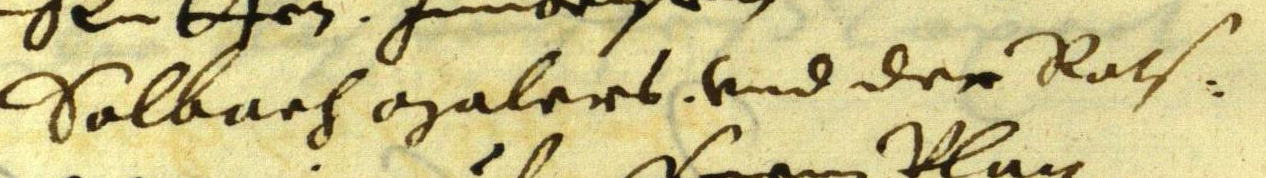Solbach Malers. vnd der Rats¬
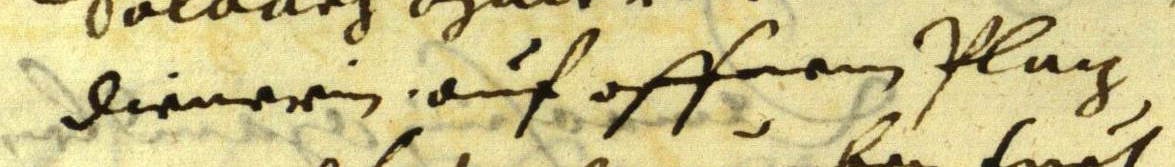dienerin. aūf offnem Plaz
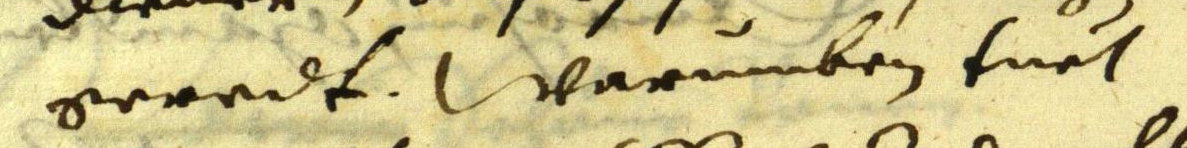geredt. Warūmben tūet
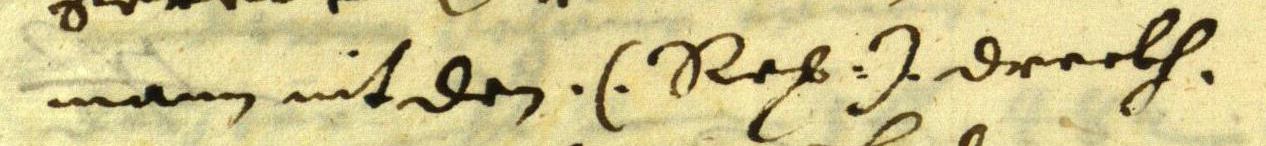man nit den .(.Re:).dreckh
